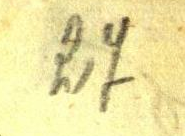27
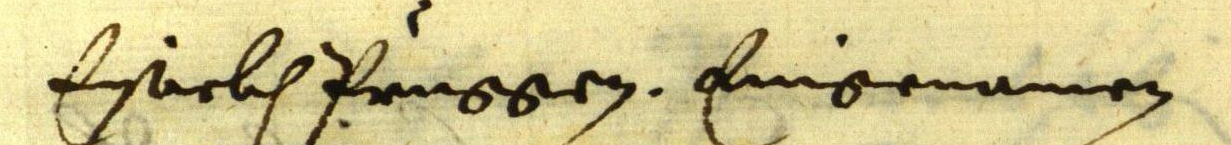Eisackh Prūggen. Eingenomen
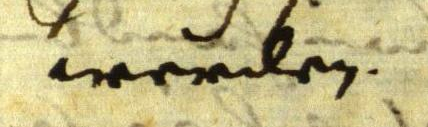werden.
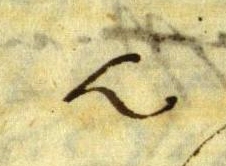t
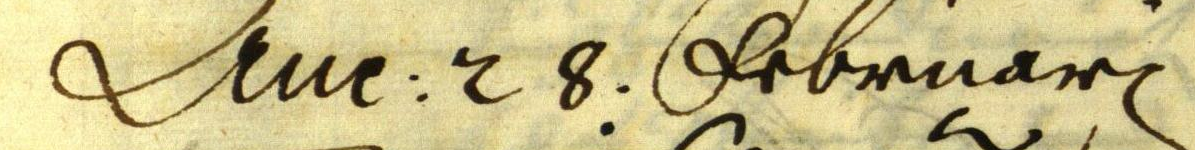Am: 28. Febrūarj
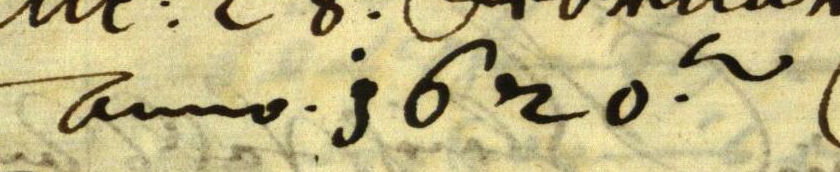Anno. 1620 t.
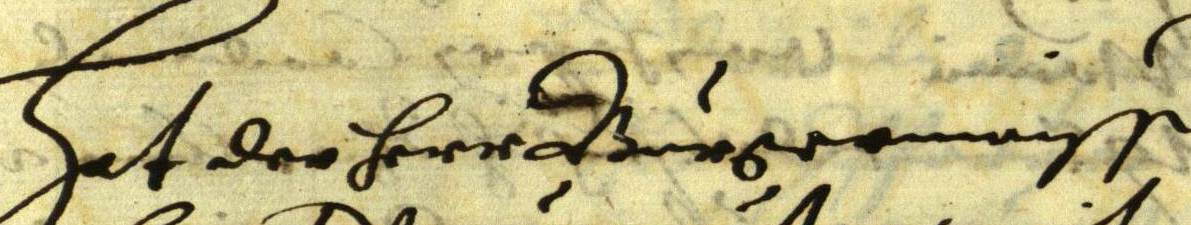Hat der herr Būrgermaisst
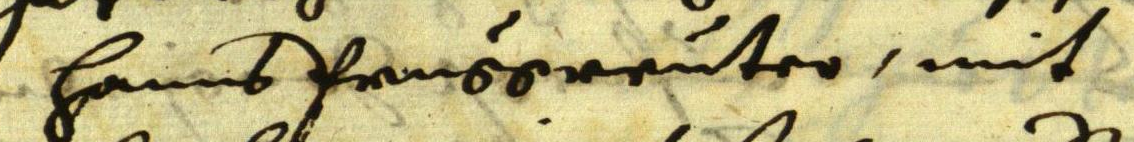Hanns Prūggreūter, mit
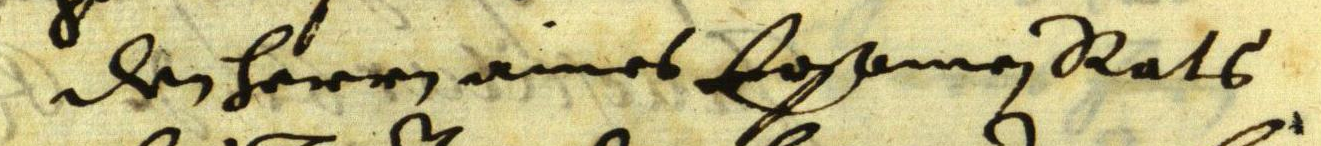den herrn aines Ersamen Rats
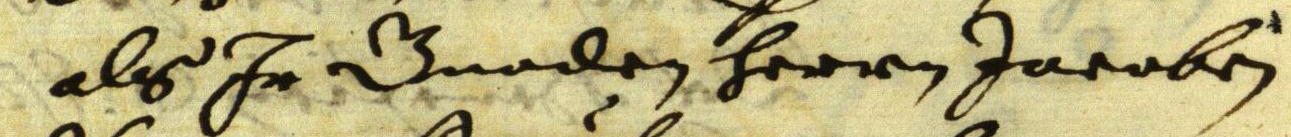also Ir Gnaden herrn Jacoben
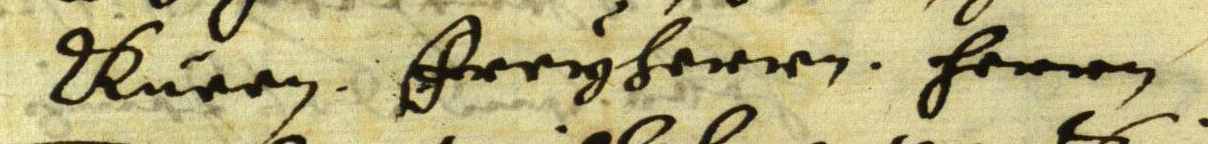Kūeen. Freȳherrn. herrn
